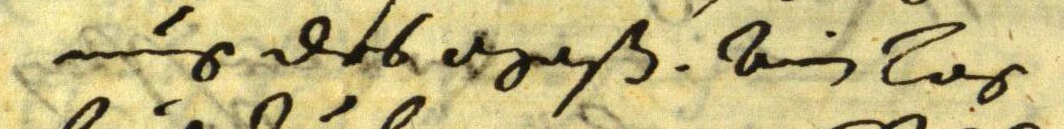ūng das Maß. Ain Tag
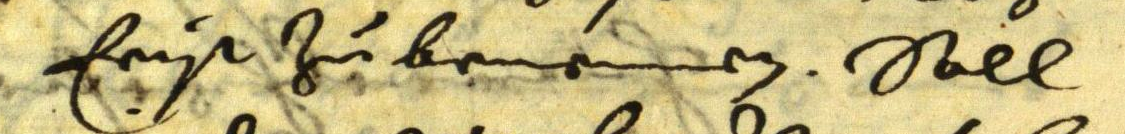Eeist Zū benennen. Soll
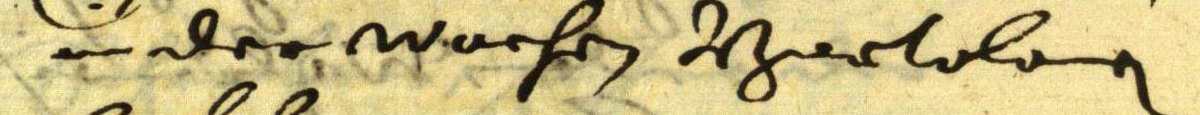in der Wochn Bartolomej
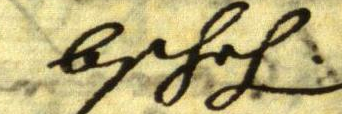bscheh.
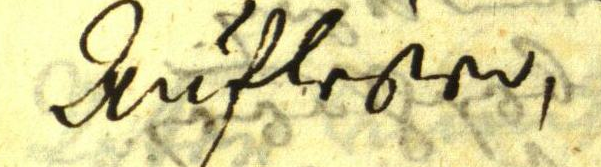Aūfleger,
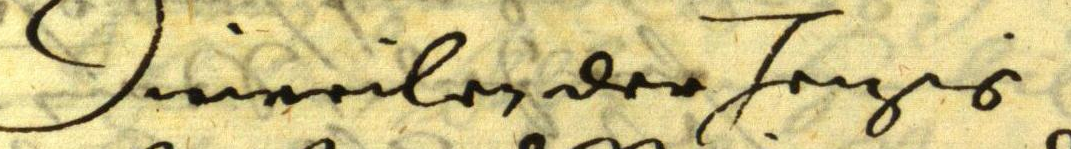Dieweiln der Jezig
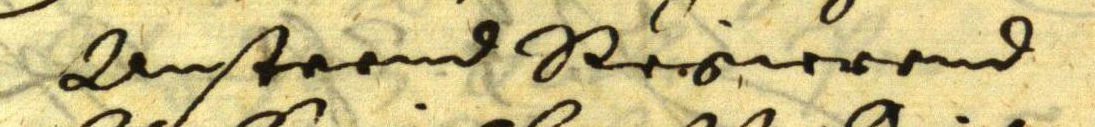Ansteend Regierend
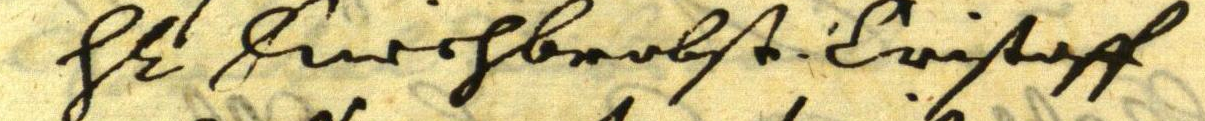hl Kirchbrobst. Cristoff
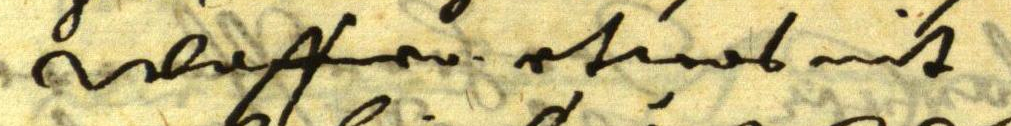Waffner. etwas nit
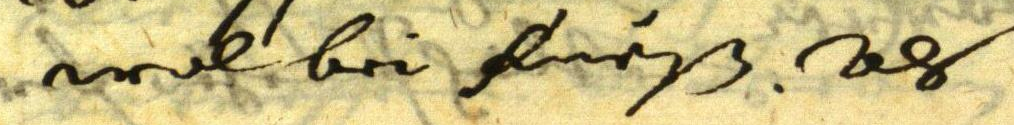wol bei Fūeß. Als
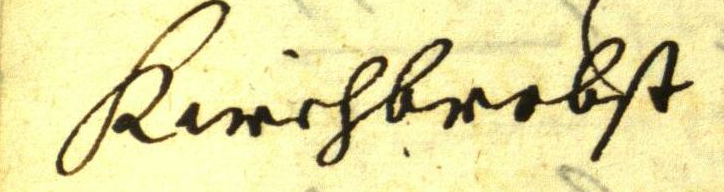Kirchbrobst
